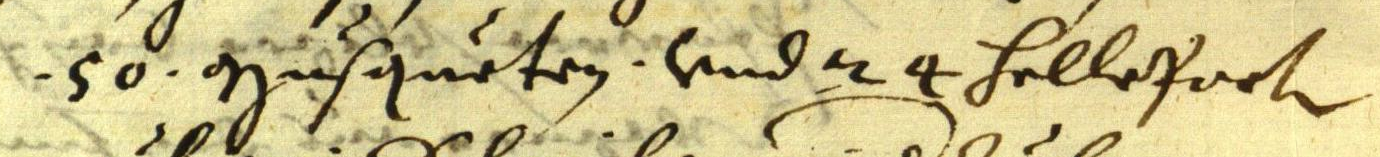50. Mūsqūeten. vnd 24 hellePart
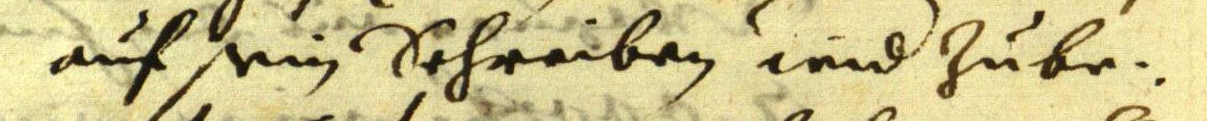aūf sein Schreiben wid Zū be¬
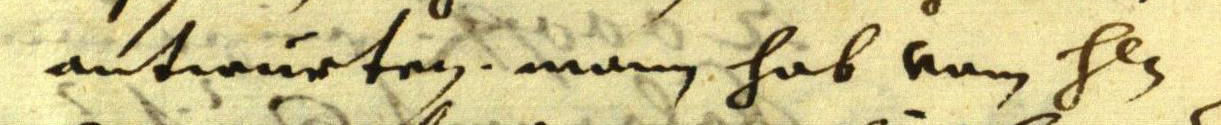antwūrten. mann hab vom hln
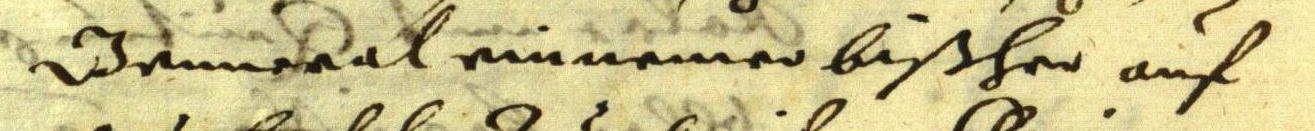Genneral einnemen bißher aūf
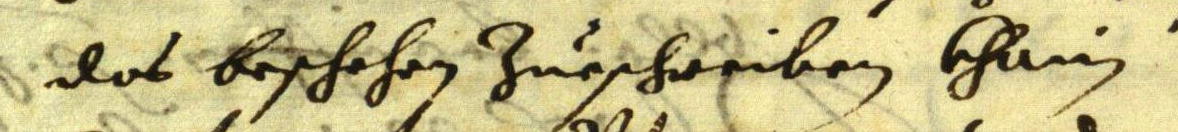das beschehen Zūeschreiben khain
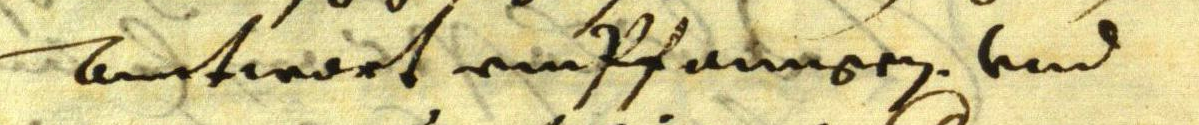Antwort empfanngen. vnd
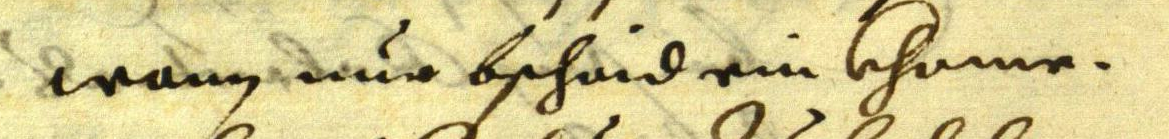wann nūr bschaid ein khome.
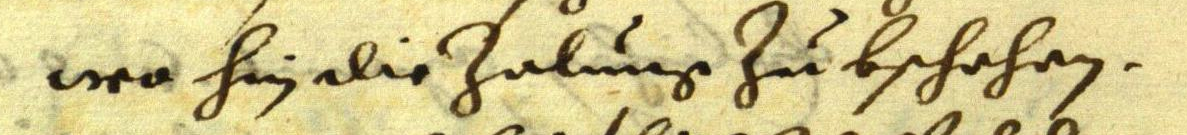wo hin die Zalūng Zū bschehen.
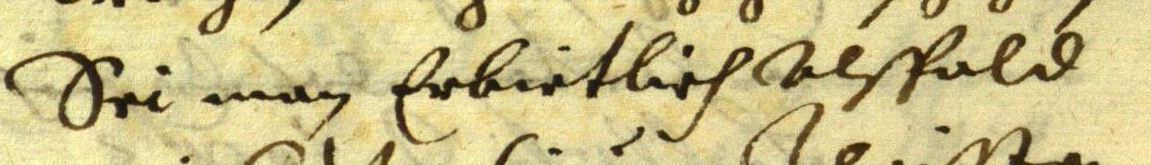Sei man Erbietlich Alspald
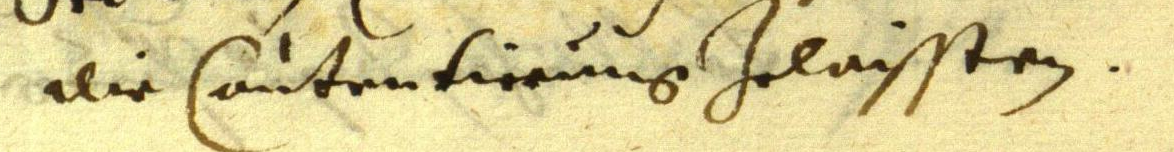die Contentierūng Zelaissten.
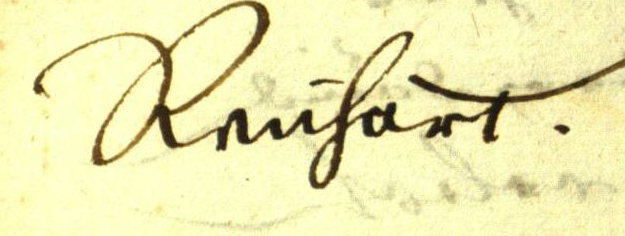Reichart.
